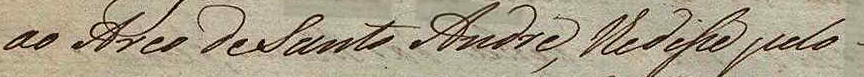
ao Arco de Santo Andre, lhe disse pelo
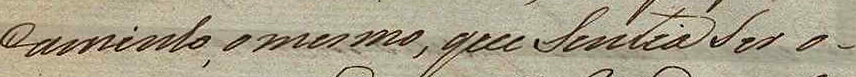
caminho, o mesmo que Sentia ser o
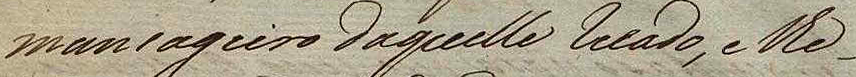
mansageiro daquelle Recado, e lhe
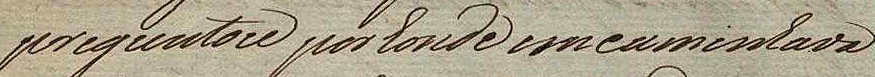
preguntou por honde emcaminhava
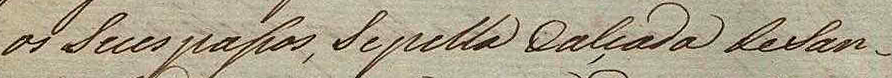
os Seus passos, Se pella calçada de San
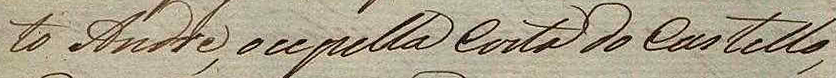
to Andre, ou pella costa do Castello,
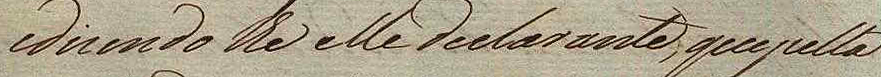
e disendo lhe elle declarante, que pella
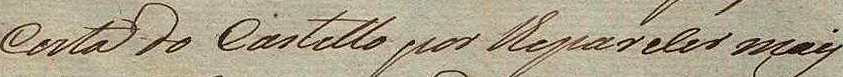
costa do castello por lhe parecer mais
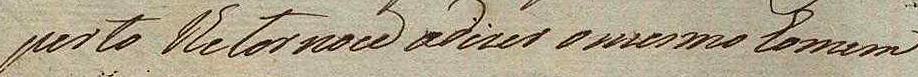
perto lhe tornou a dizer o mesmo homem
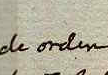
de ordem
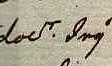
do s.r Inq.or
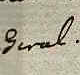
Geral.
